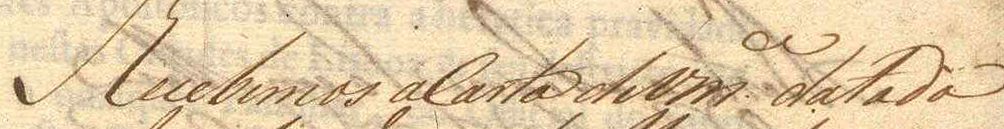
Recebemos a Carta de V M.ce datada
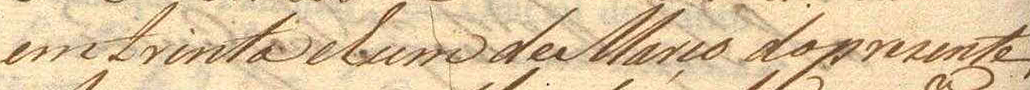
em trinta, e hum de Março do prezente
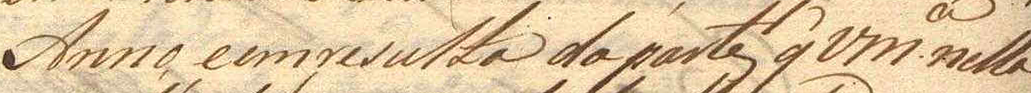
Anno, e em resulta da parte q̄ V M.ce nella
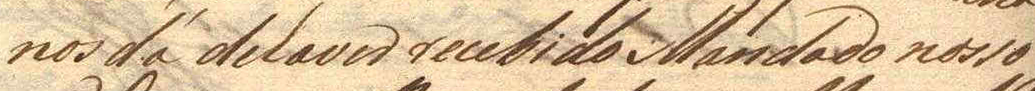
nos dá de haver recebido Mandado nosso
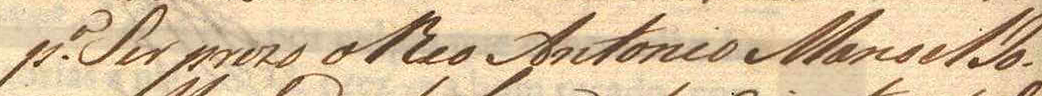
p.a Ser prezo o Reo Antonio Manoel Io
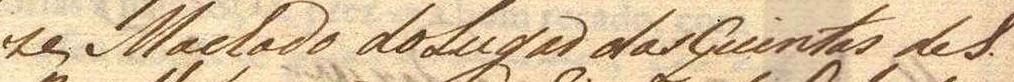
ze Machado do Lugar das Quintas de S.
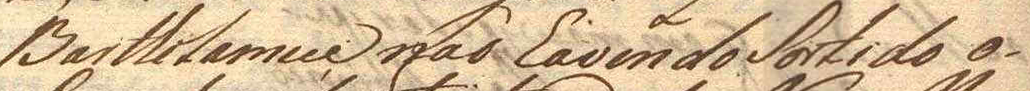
BarthoLameu, naõ havendo Sortido o
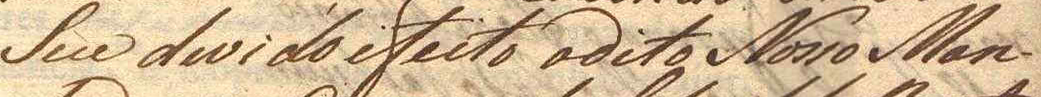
seu devido efeito o dito Nosso Man
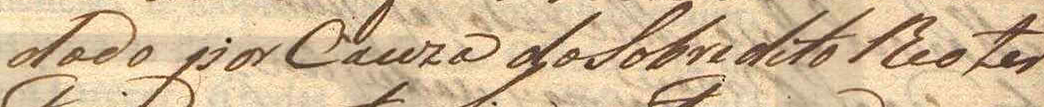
dado por Cauza do Sobredito Reo ter
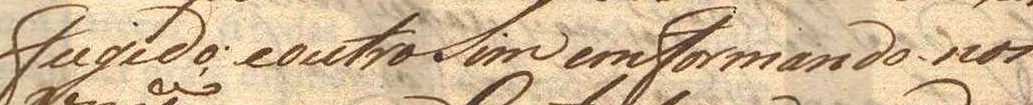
fugido; e outroSim emformando-nos
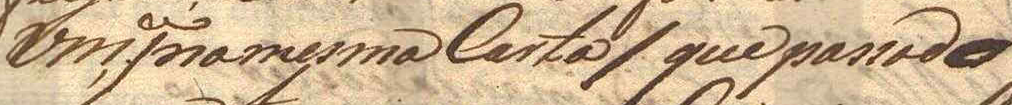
V M.ce /na mesma Carta/ que passado
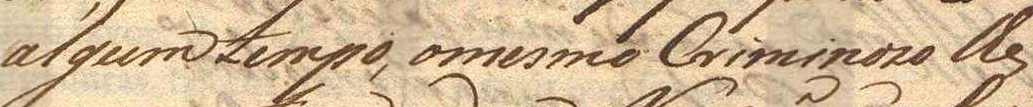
algum tempo, o mesmo Criminozo lhe
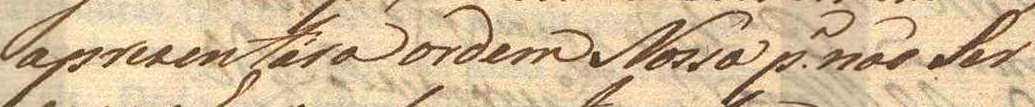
aprezentara ordem Nossa p.a naõ Ser
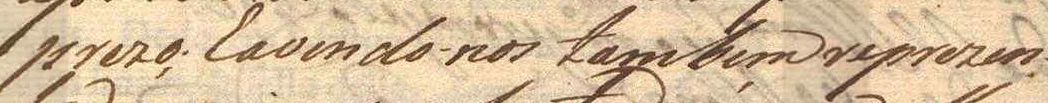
prezo; havendo-nos tambem reprezen
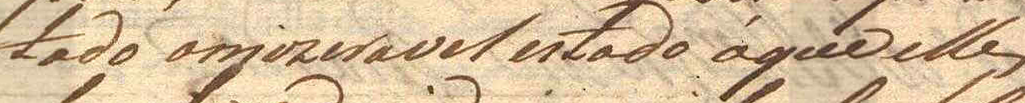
tado o mizeravel estado á que elle
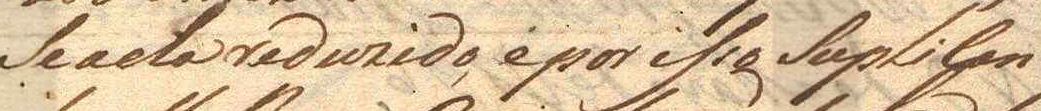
se acha reduzido, e por isso SupliCan
